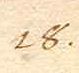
18.
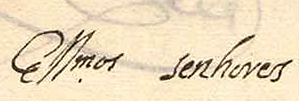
Ell.mos senhores
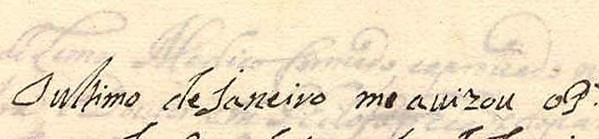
O ultimo de Ianeiro me auizou o P.e
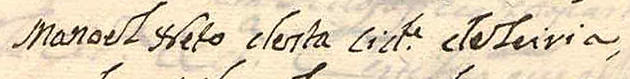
Manoel Neto desta cid̄.e de Leiria,
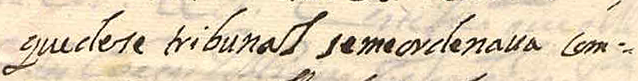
que dese tribunal se me ordenaua com
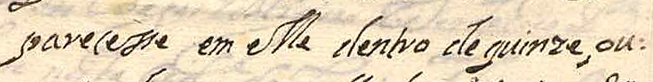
parecesse em elle dentro de quinze, ou
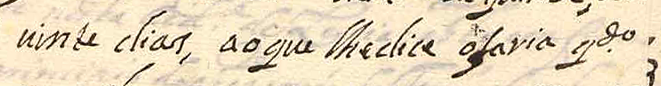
uinte dias, ao que lhe dice o faria q.do
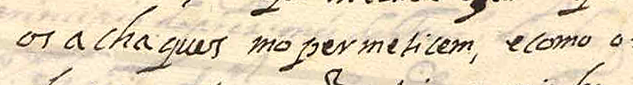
os achaques mo permeticem, e como o
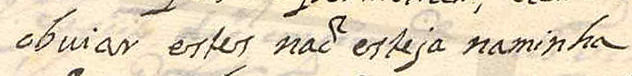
obuiar estes naõ esteja na minha
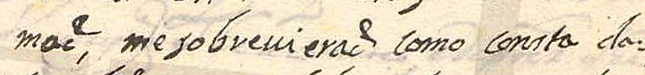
maõ, me sobreuieraõ como consta da
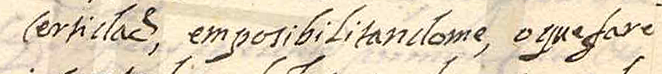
certidaõ, emposibilitandome, o que fare
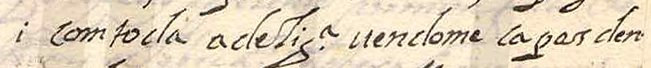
i com toda a delig.a uendome capas den
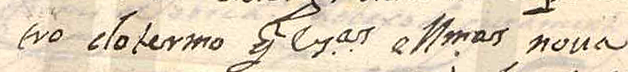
tro do termo q̄ vs.as ell.mas noua
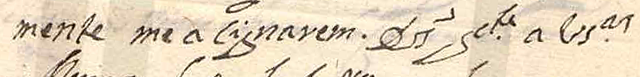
mente me acignarem. Ds̄ gd.e a Vs.as
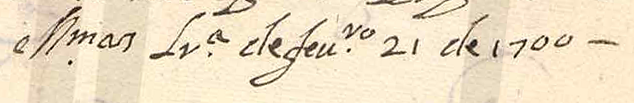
ell.mas Lx.a de feu.ro 21 de 1700 -
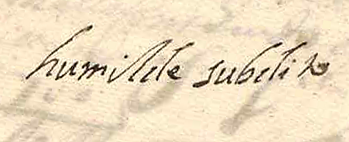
humilde subdito
